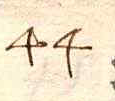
44
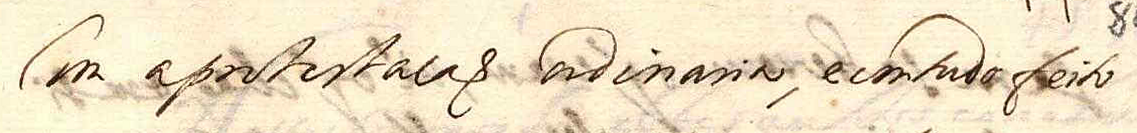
Com a protestaçaõ ordinaria, e em tudo feito
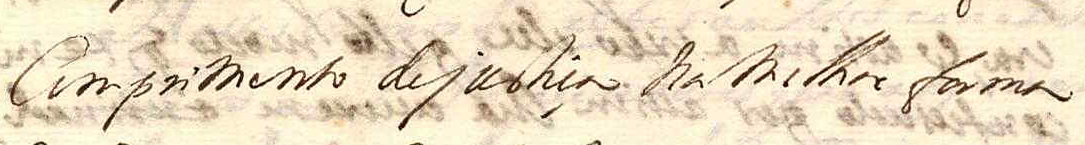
Comprimento de justiça na melhor forma
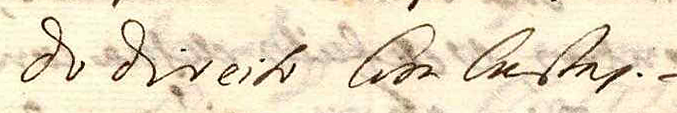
do direito Com Custas.
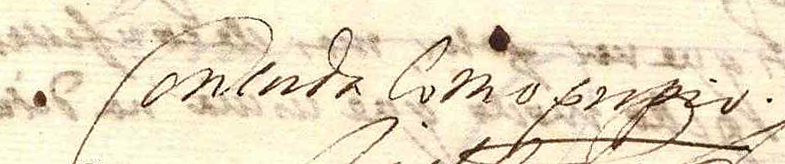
Concorda com o propio.
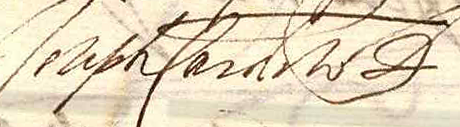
Jozeph Cardozo
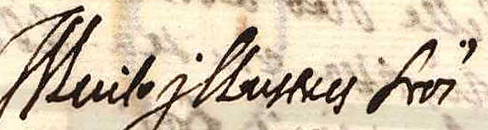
Muito Jllustres Sres̄
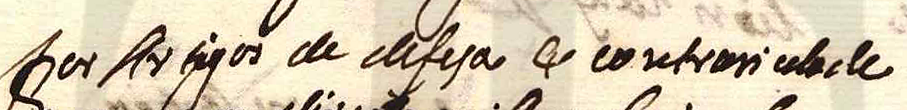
Por Artigos de defesa & contrariedade
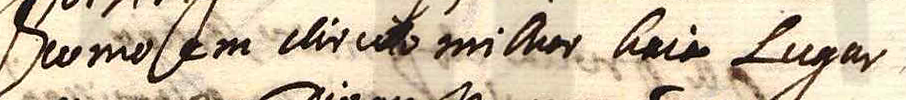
como em direito milhor haia Lugar
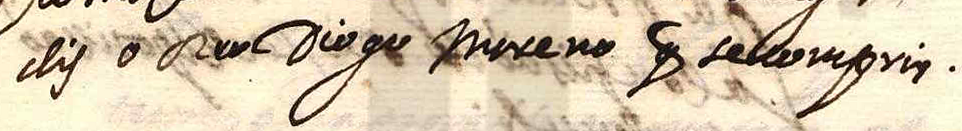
dis o Reo Diogo Moreno q̄ se comprir.
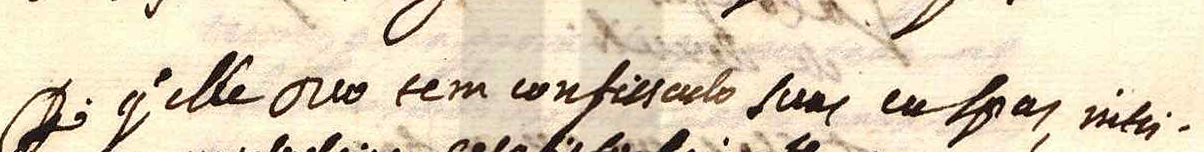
P. q̄ elle Reo tem confissado suas culpas intei
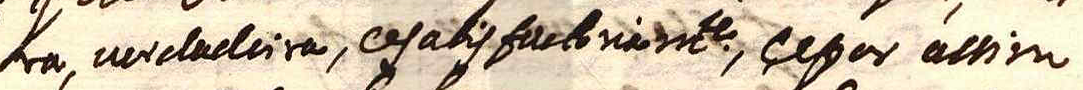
ra, uerdadeira, & satisfactoriamte, & por assim
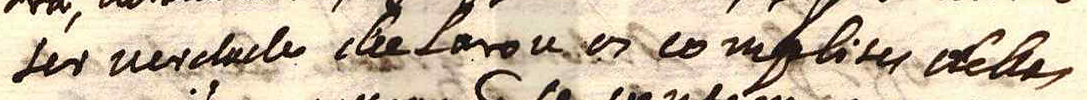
ser uerdade declarou os complises dellas
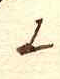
1
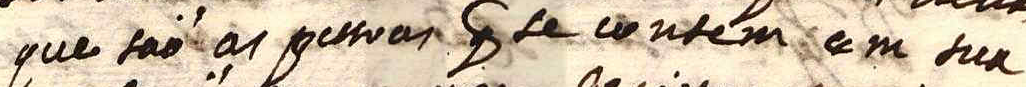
que saõ as pessoas q̄ se contem em sua
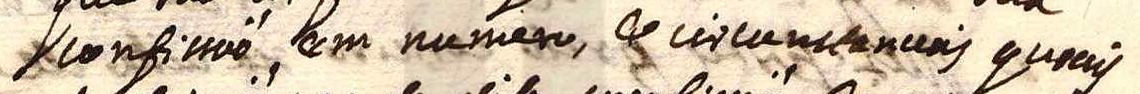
confissão, em numero, & circunstancias quoais
